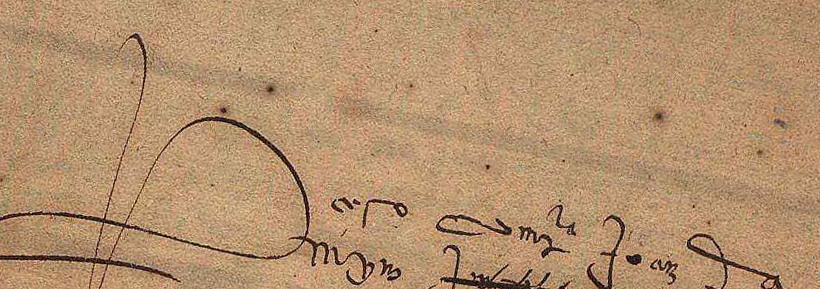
Pceso Comtra Joam da
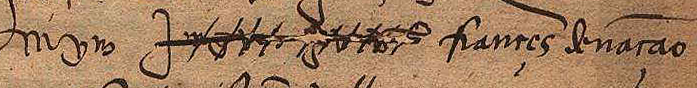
mym Jmgres _ frances de nação
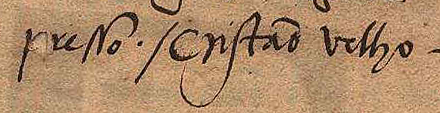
presso. / cristão velho
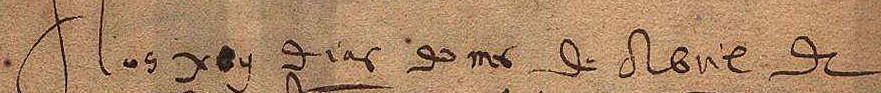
Aos xbij dias do mes de Abril de
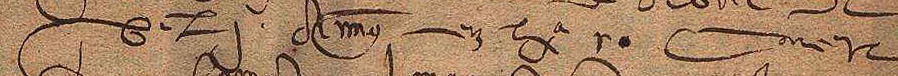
j̄bcLj An̄nꝯ em Lxa no Carcere
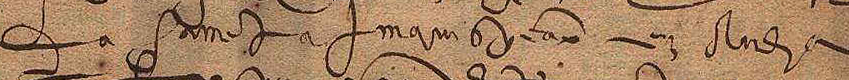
da samcta Jmquisyção em Audja
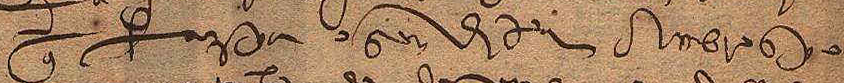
q̄ fazya o s̄or djtor Ambrosyo
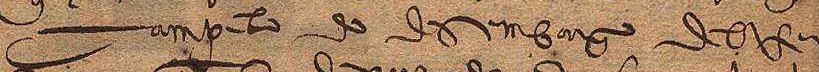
Campelo do desembargo del Rey
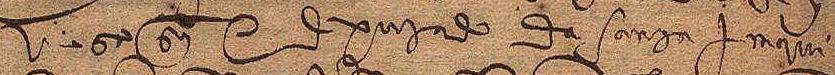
Noso s̄or e deputado da santa Jmqui
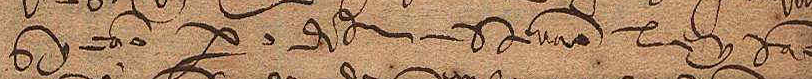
syção ꝑ o djtor esteuão Leytão
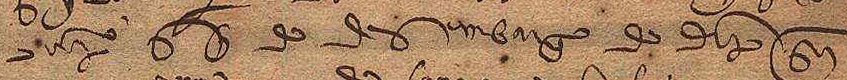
outrosy do desembago do dīto s̄or
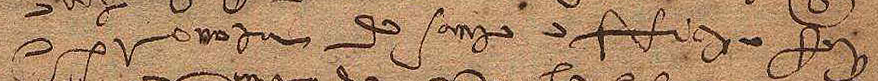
e promotor do santo officyo foy
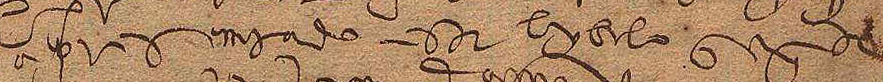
apresemtado este lybelo seḡte
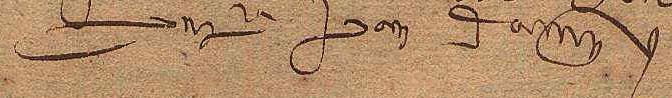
Contra Joam damȳ
